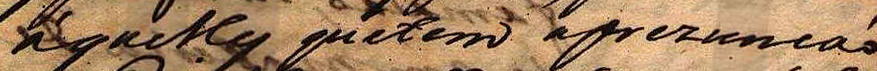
àquelles que tem a prezunçaõ
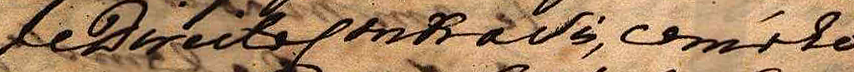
de Direito Contra Si, como he
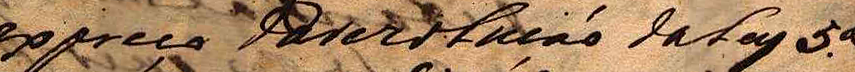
expreço Para resoluçaõ da Ley 5.a
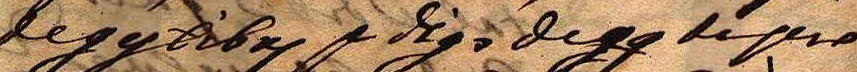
de gestibus p digo degg de pro
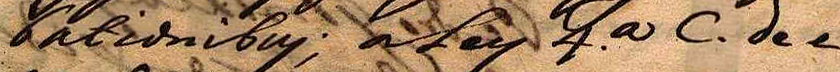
bationibus; a Ley 4.a C. de e
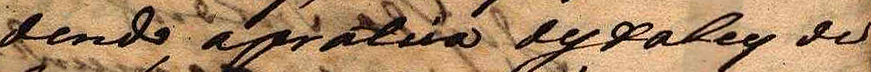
dendo, a pratica desta ley de
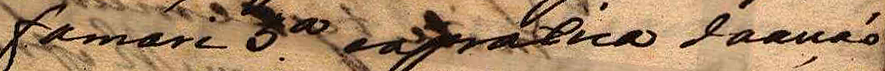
famari 3.a e a pratica da acçaõ
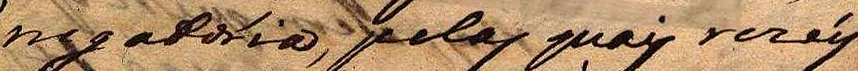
negatória, pelas quais rezoẽs
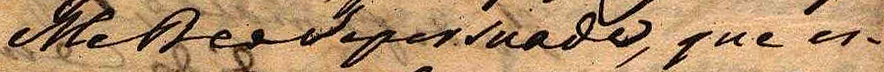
elle Reo se persuade, que es
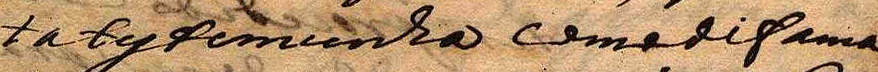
ta testemunha com a difama
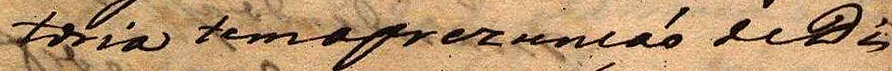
toria tem a presunçaõ de Di
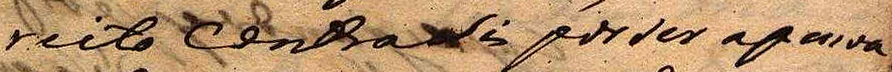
reito contra si por ser a pessoa,
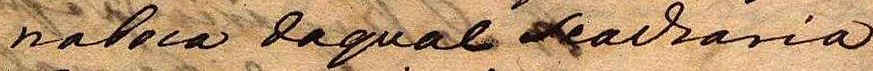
na boca da qual se acharia
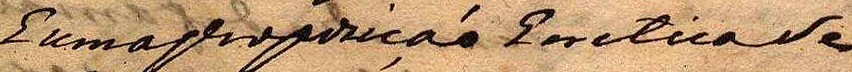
huma propoziçaõ heretica Se
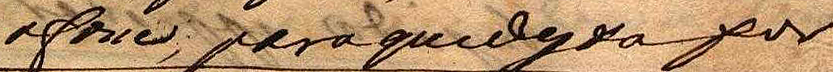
a fosse; para que desta for
